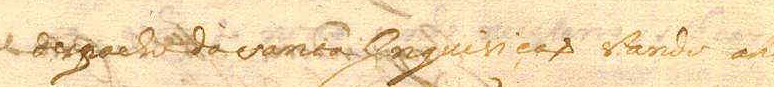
despacho da santa Jnquisiçaõ estando ahi
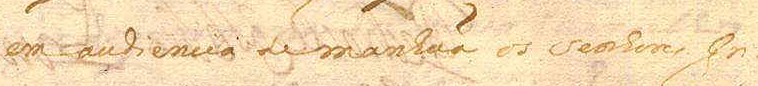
em audiencia de manhaã os Senhores Jn
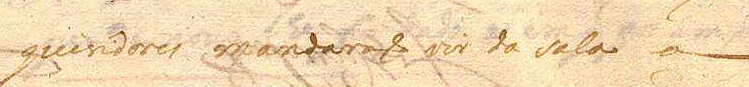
quisidores mandaraõ vir da sala a
